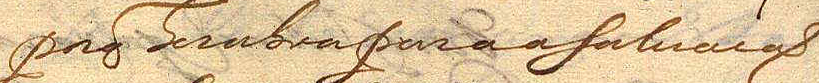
porq̄ hera boa para a saluacaõ
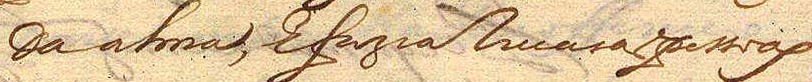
Da alma, E fazia Riccas as pessoas
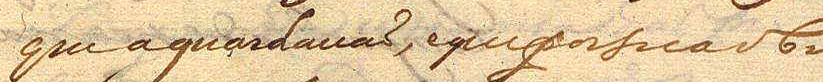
que a guardauaõ, e que por sua ob
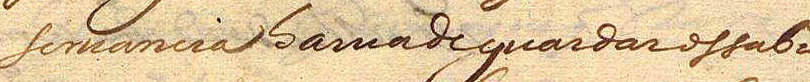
seruancia hauia de guardar os sab
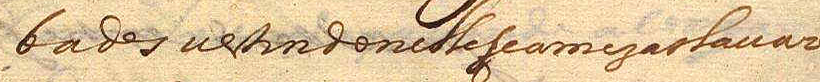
bados uestindo nelles camizas laua
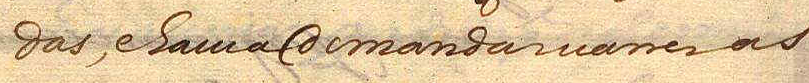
das, e hauia de mandar uarrer as
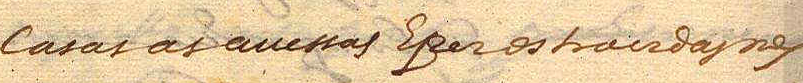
casas as auessas E por os trocidas nos
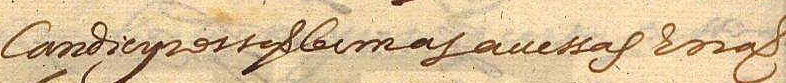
Candieyros taõbem as auessas E naõ
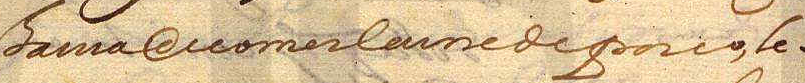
hauia de comer carne de porco, le
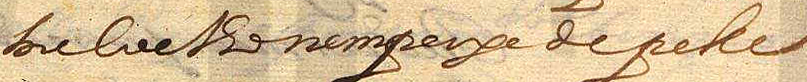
bre Coelho nem pexe de pelle
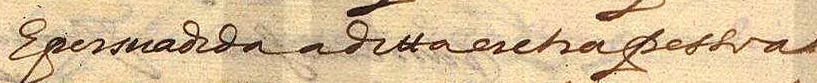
E persuadida a ditta outra pessoa
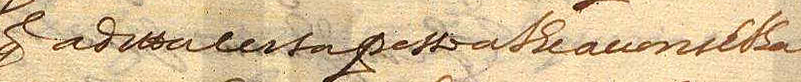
q̄ a ditta certa pessoa lhe acconselha
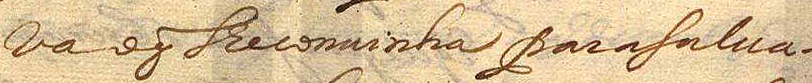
va o q̄ lhe conuinha para salua
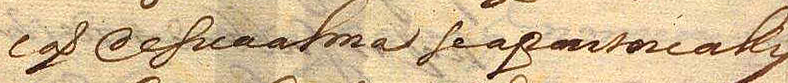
caõ de sua alma se apartou ally
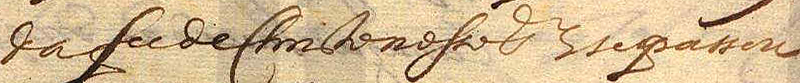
da fee de Christo nosso sor E se passou
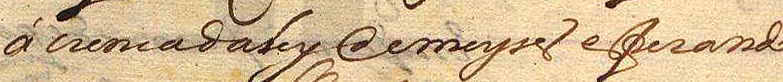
á crenca da ley de moyses esperando
